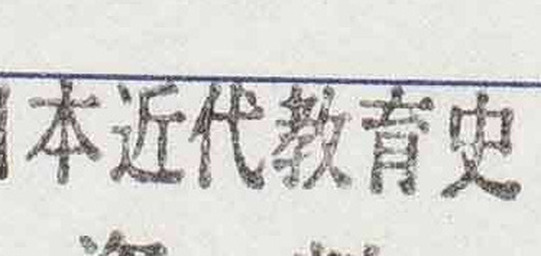日本近代教育史
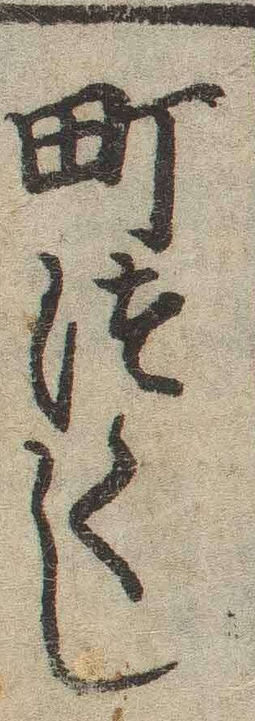町つくし全
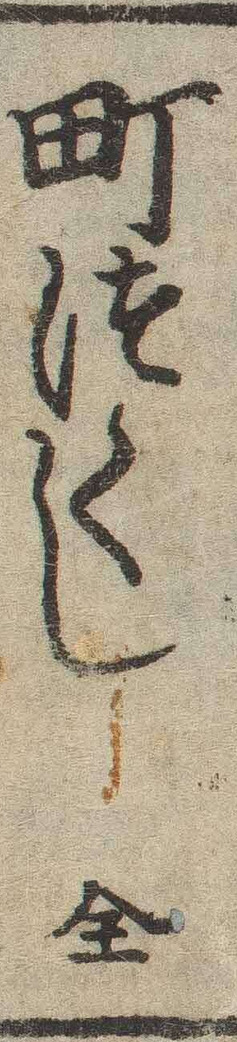町つくし全

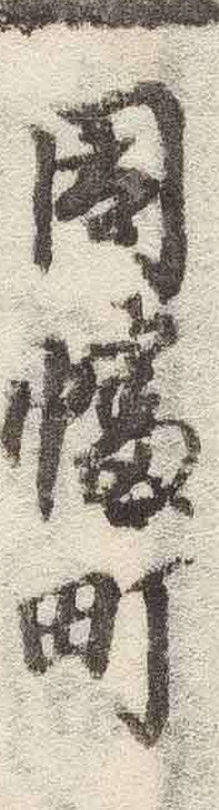因幡町
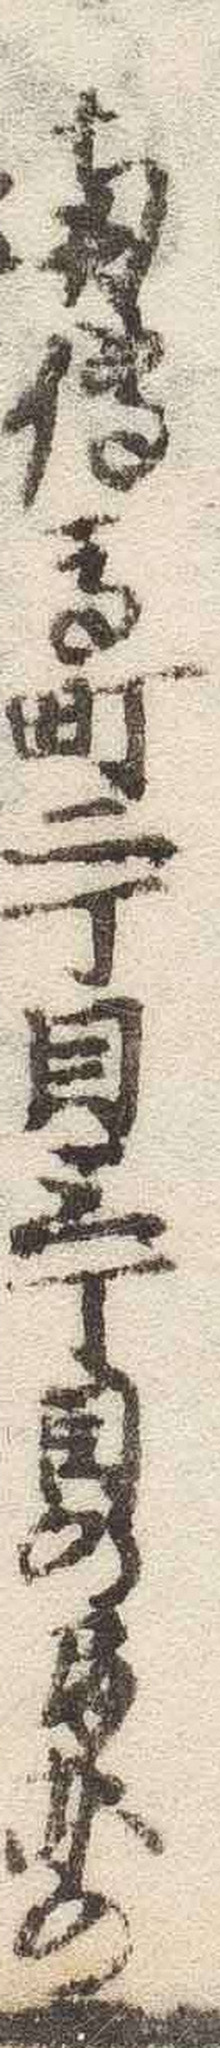南伝馬町二丁目三丁目の南東の
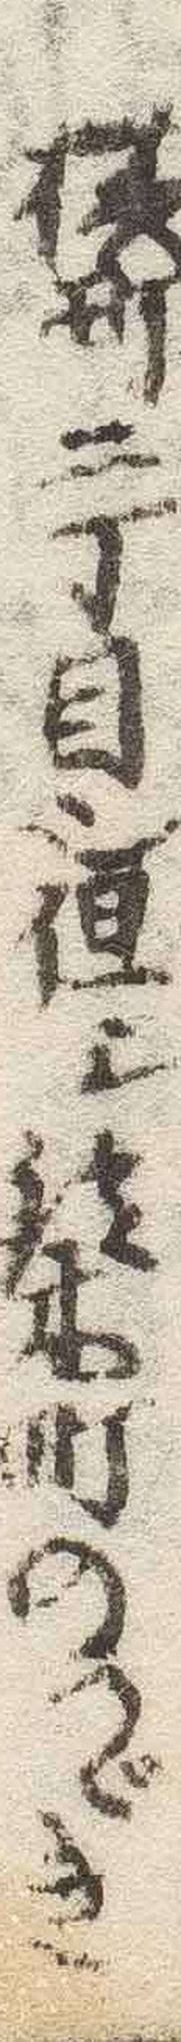横川二丁目也但し鈴木町のつゞき
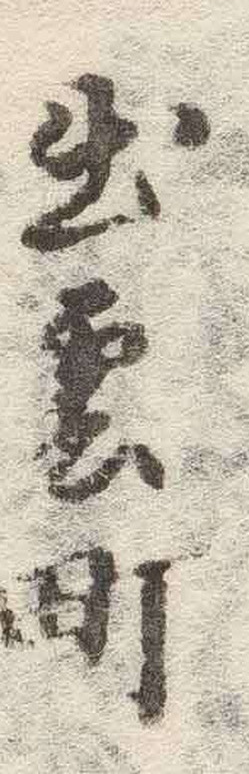出雲町
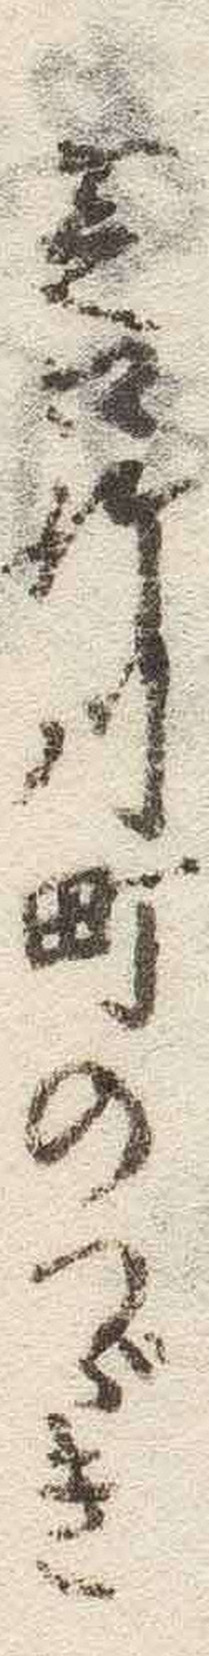芝口竹川町のつゞき
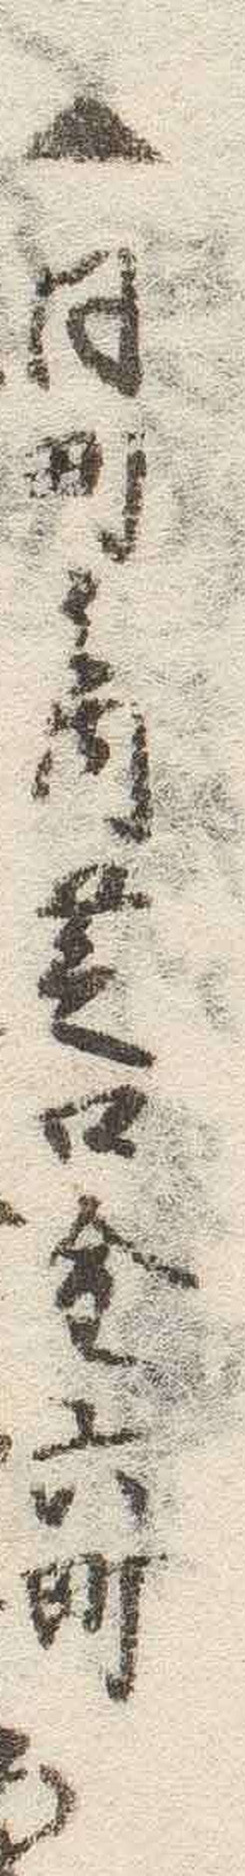▲同町の内芝口金六町
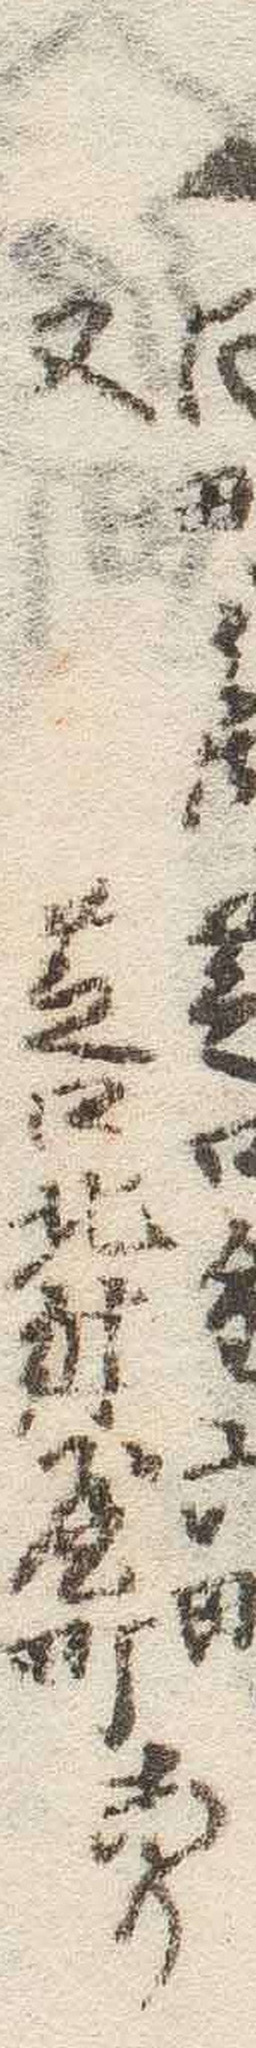又芝口北紺屋町あり
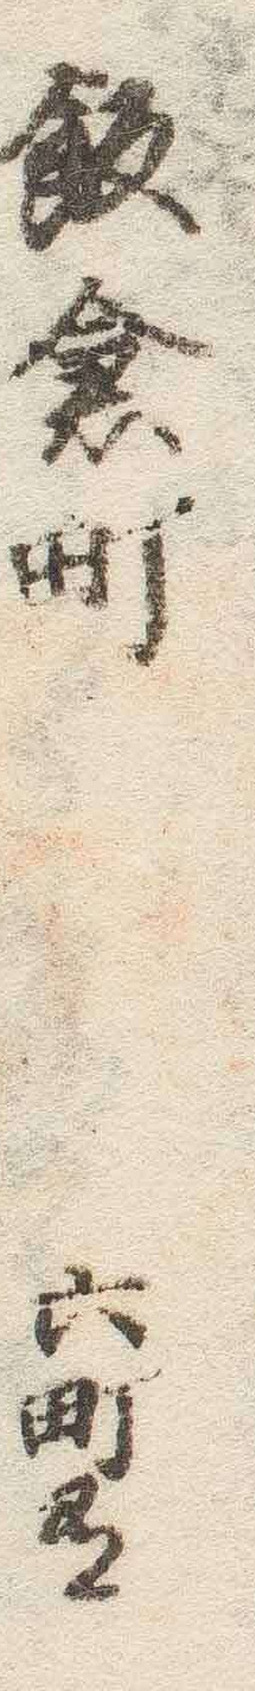飯倉町六町有
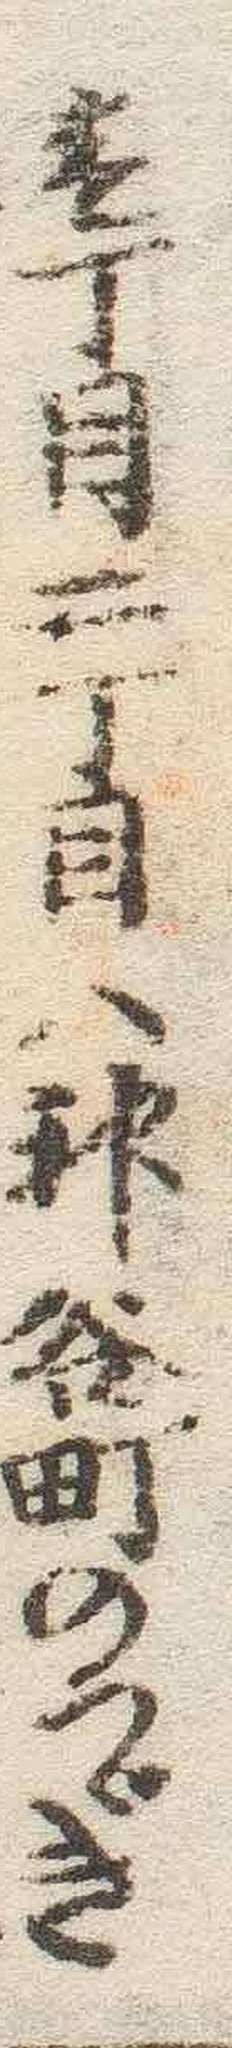壱丁目二丁目は神谷町のつゞき
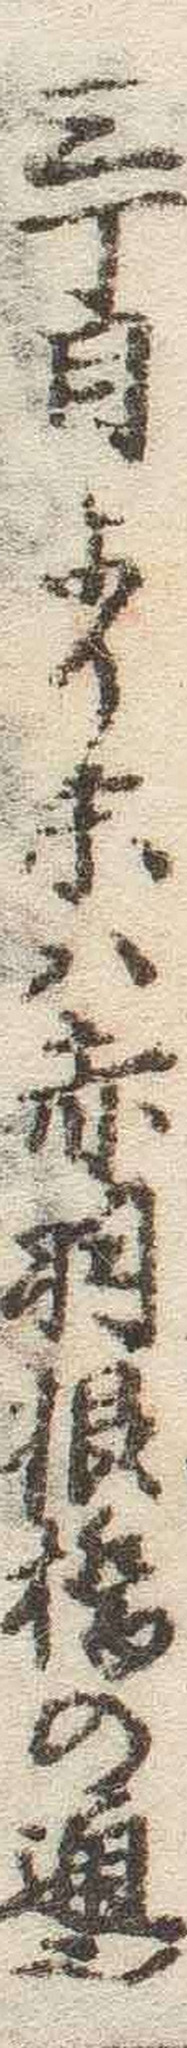三丁目より末は赤羽根橋の通也
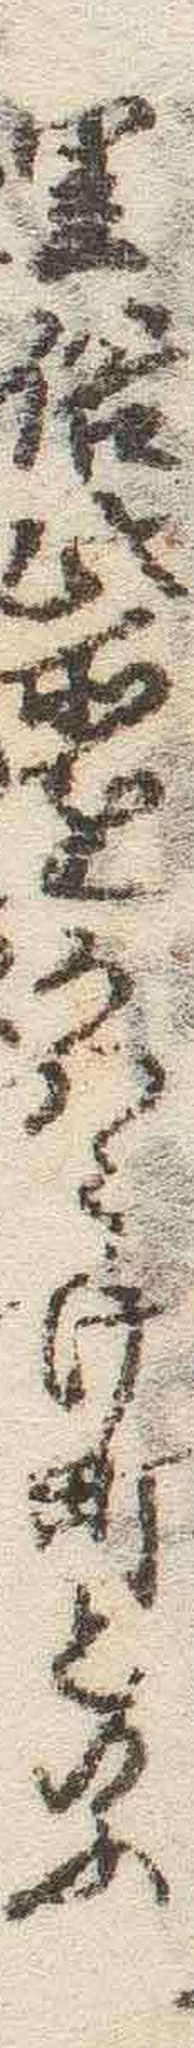里俗此所をかはらけ町といふ
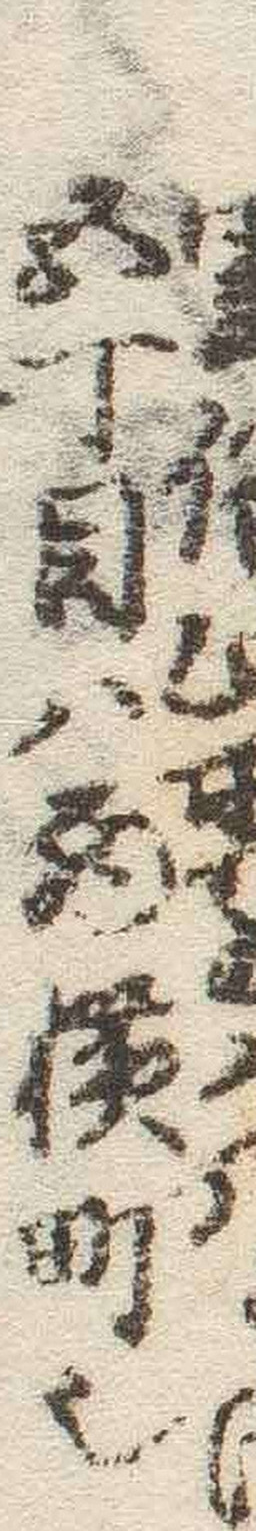五丁目は西横町也
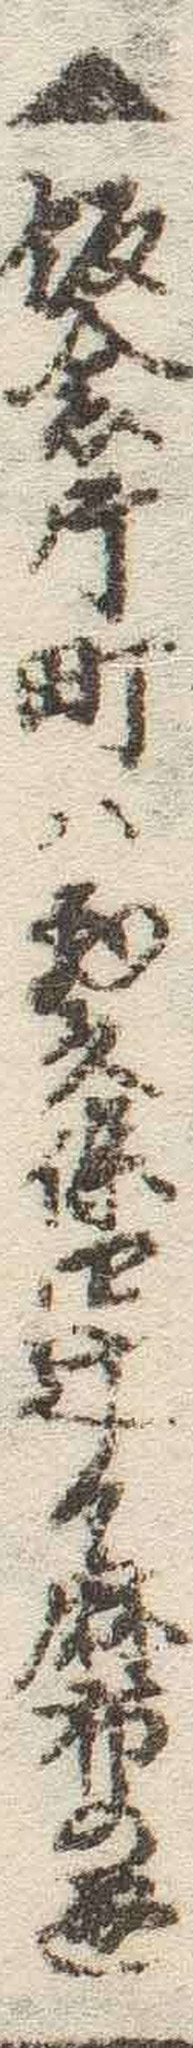▲飯倉片町は西久保四辻辺麻布の通
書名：江戸町独案内
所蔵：東京学芸大学附属図書館 国文学研究資料館
